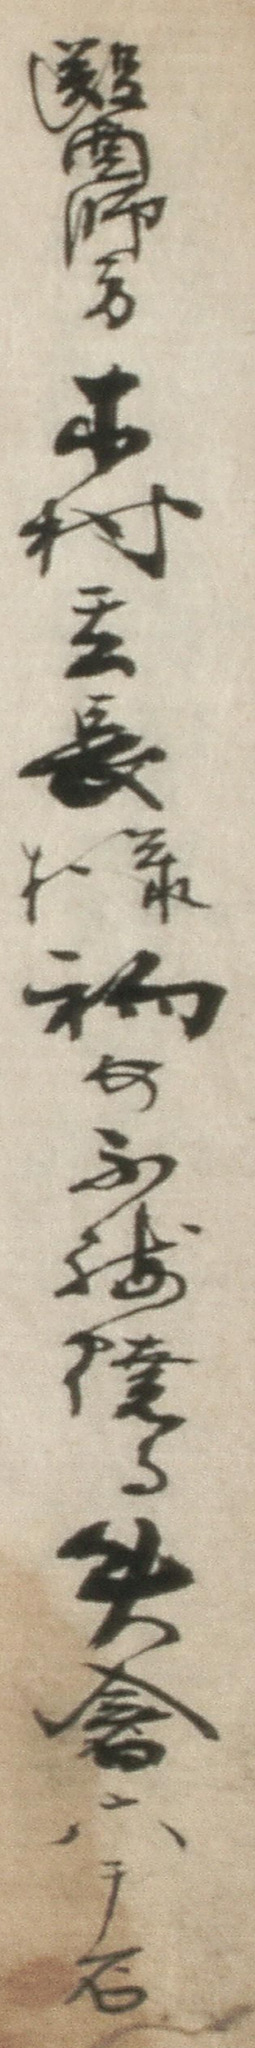医師方木村玄長様物は不残焼る矢倉六千石
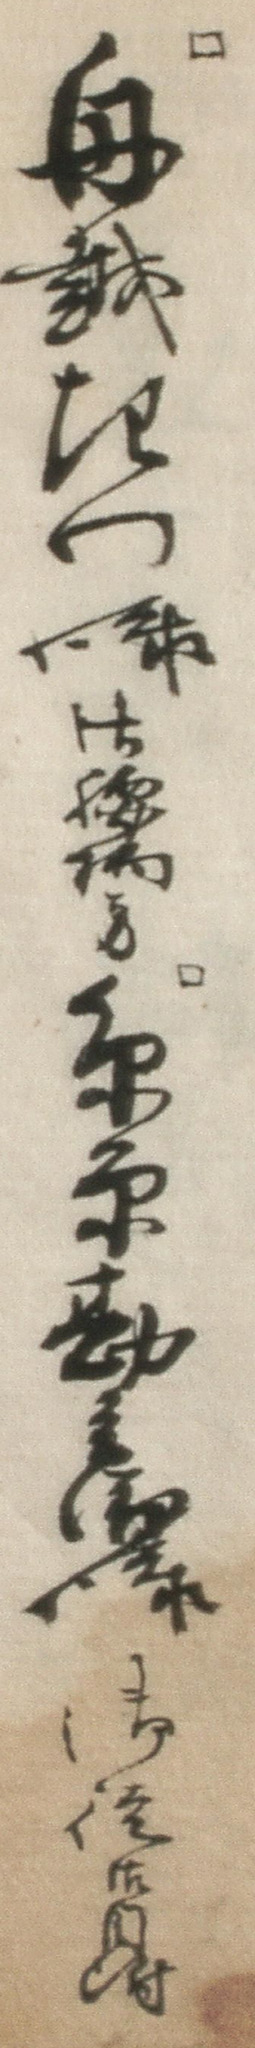▢舟越左門様御腰物方▢糸原勘兵衛様御徒御目付
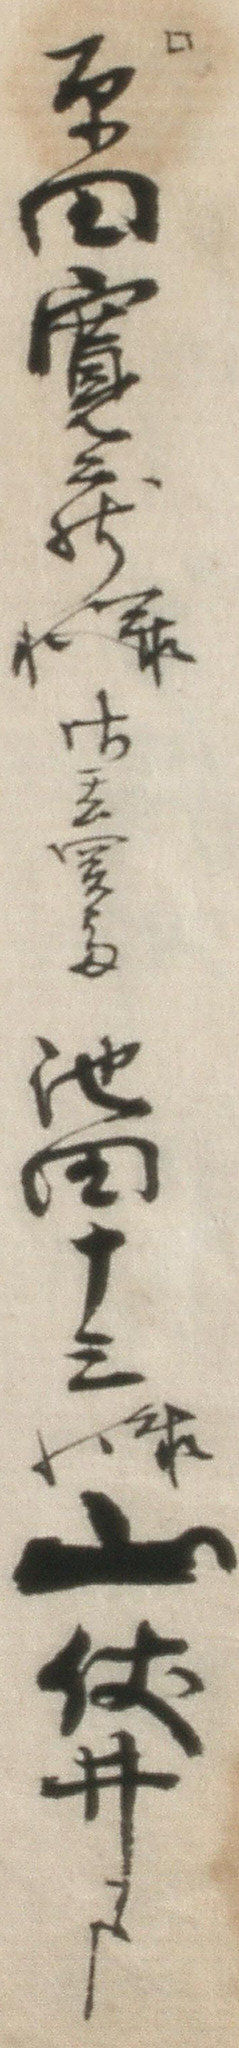▢原田寛蔵様御玄関番池田十三様山伏井部？
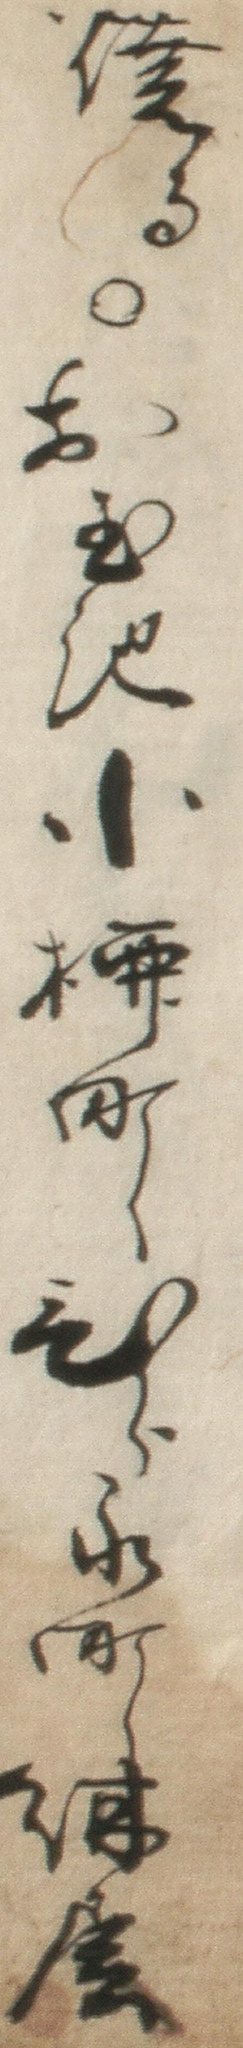焼る○お玉池小柳町ひら永町陣屋

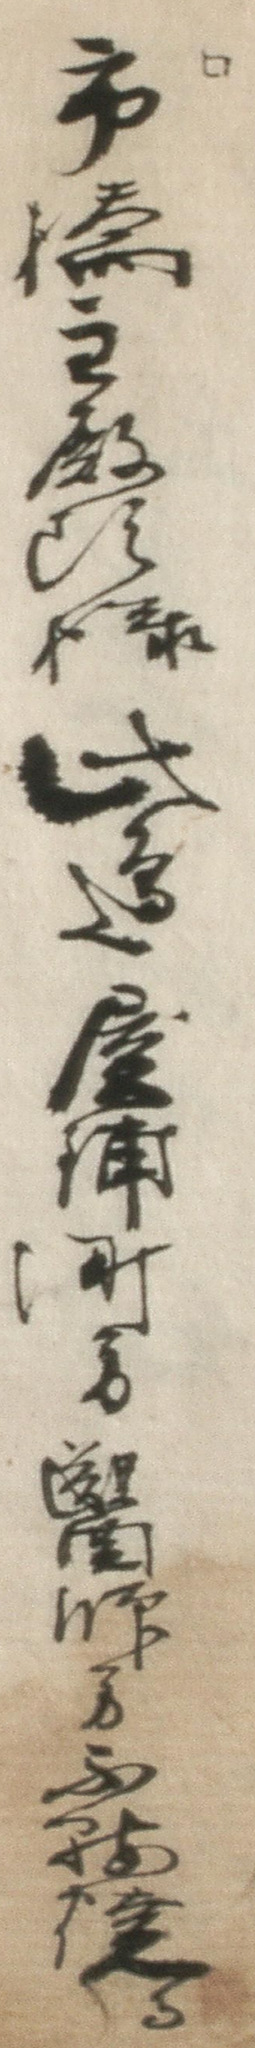▢市橋主殿頭様此辺屋鋪町方医師方不残焼る
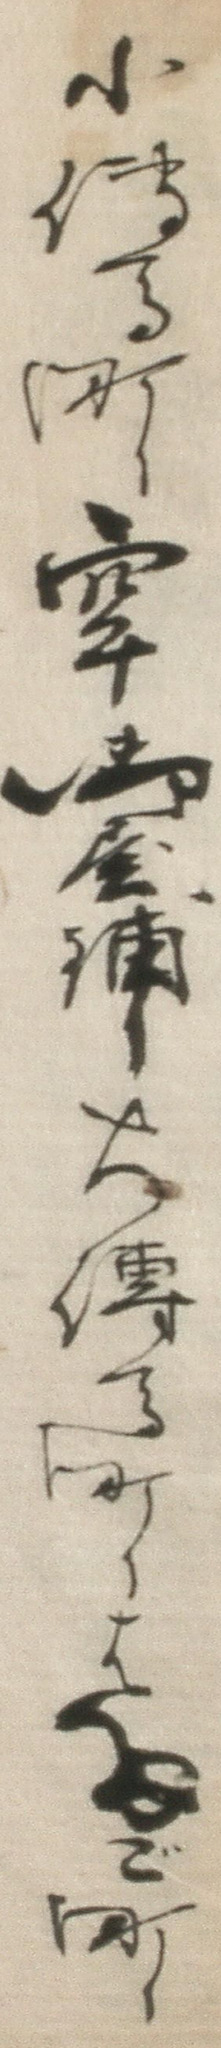小伝馬町牢御屋鋪大伝馬町はたご町
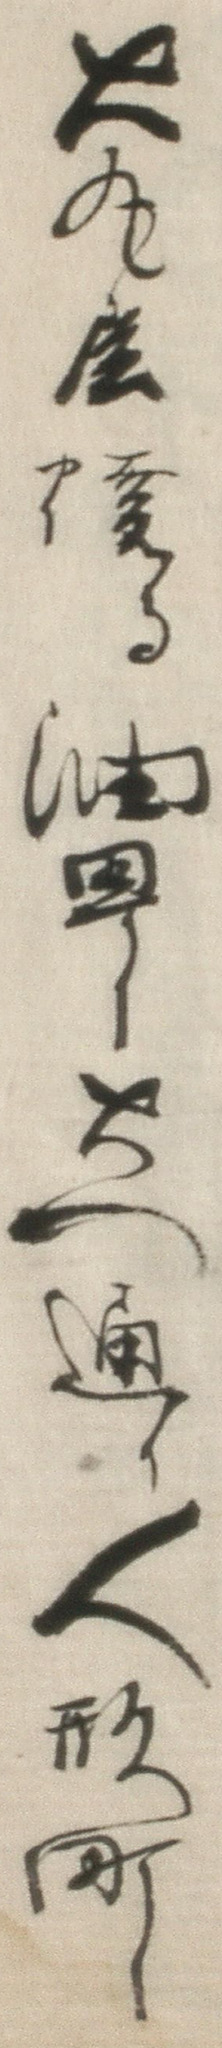大丸屋焼る油町大へ通り人形町
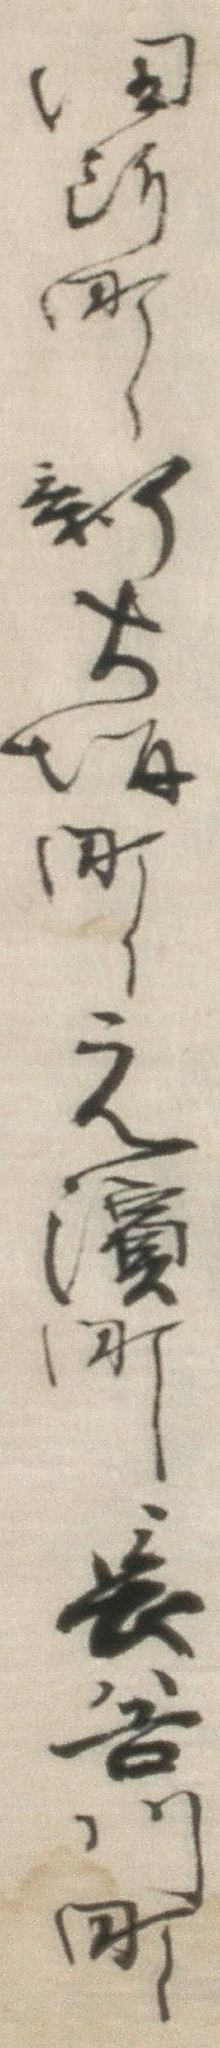田所町新大坂町元浜町長谷川町
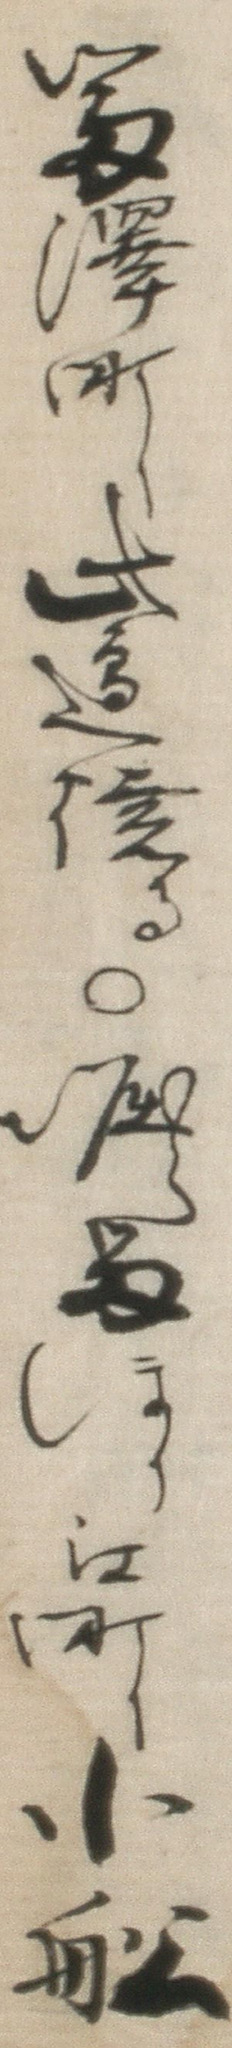富沢町此辺右焼る○堀留ほり江町小船
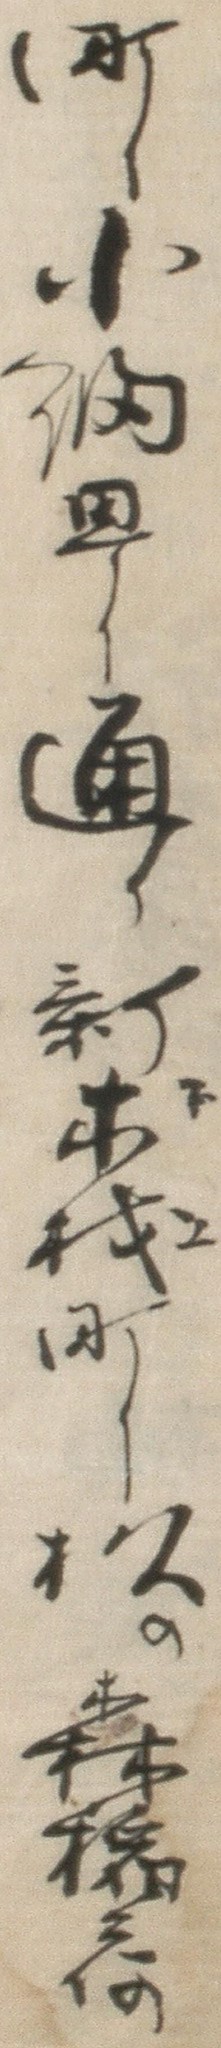町小細町通り新木材町杉の森稲荷
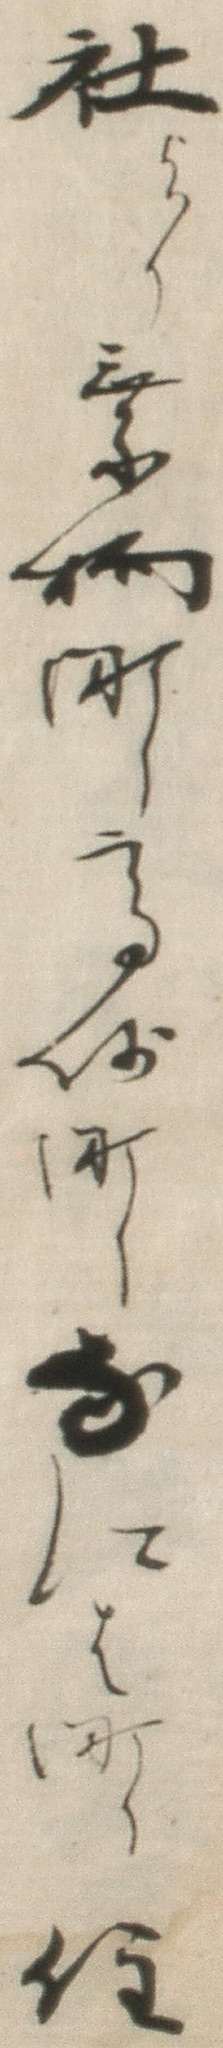社より乗物町高砂町なには町住
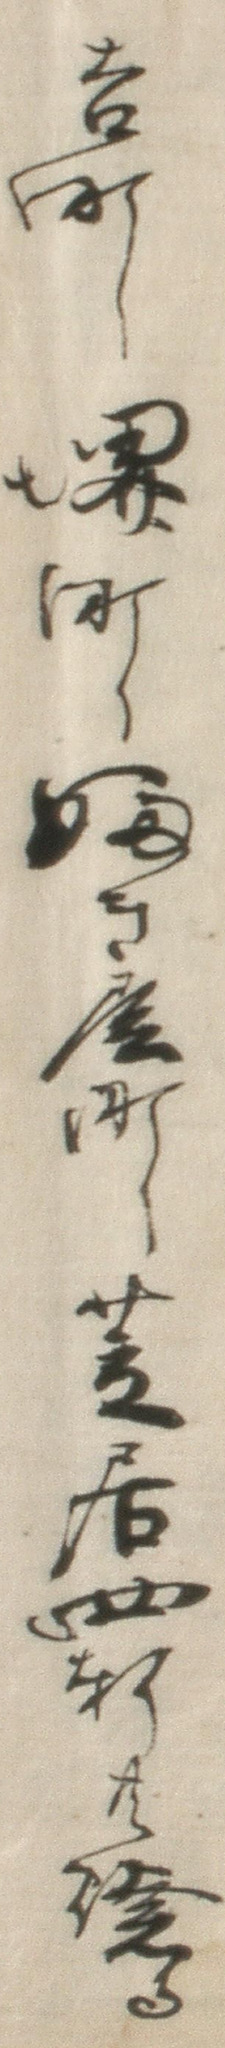吉町堺町ふき屋町芝居四軒共焼る
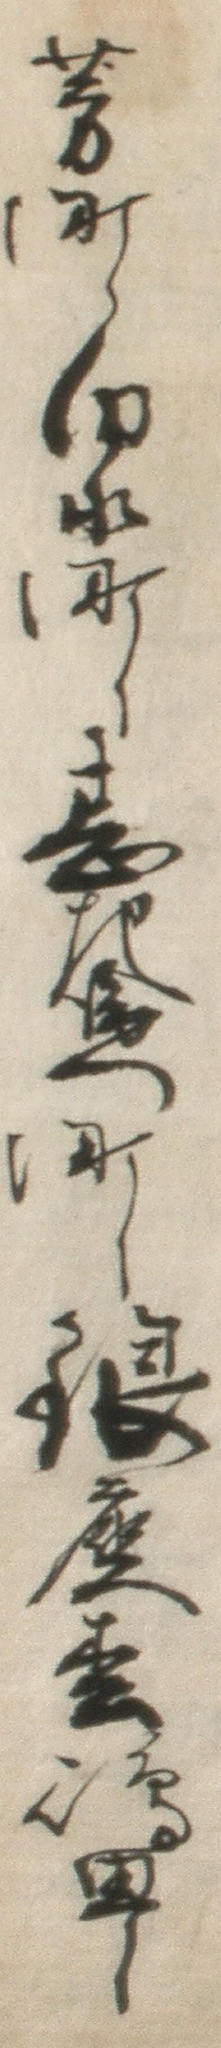芳町泉町甚左衛門町銀座松嶋町

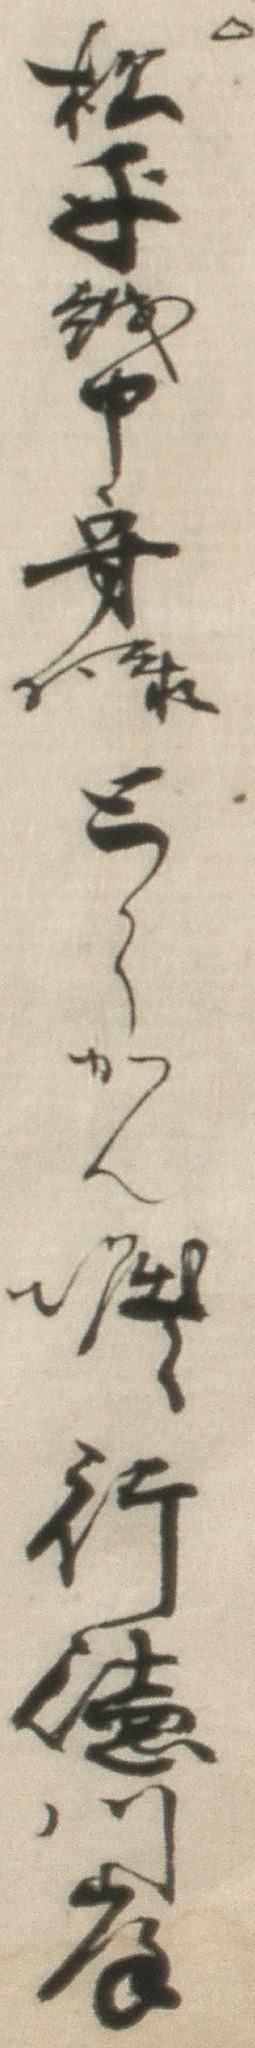△松平越中守様とうかん堀行徳川岸
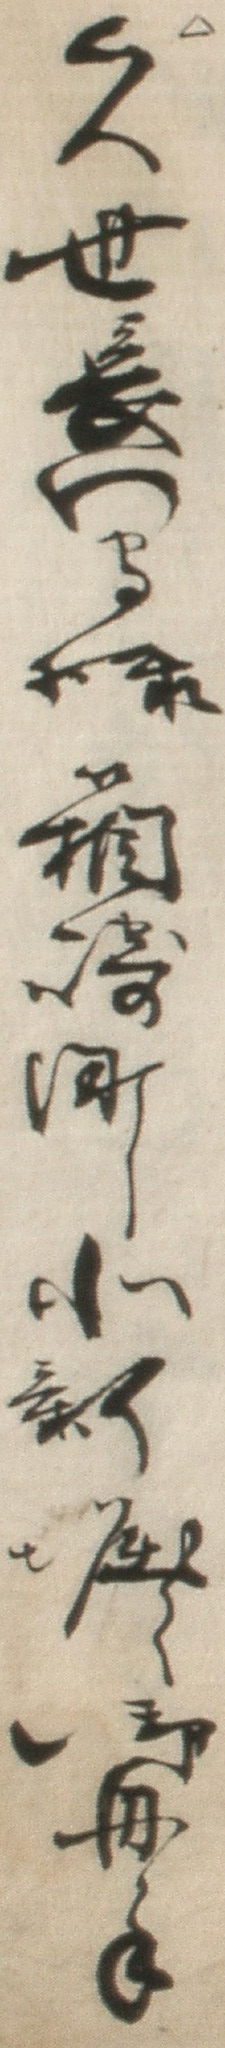△久世長門守様箱崎町北新堀御舟手
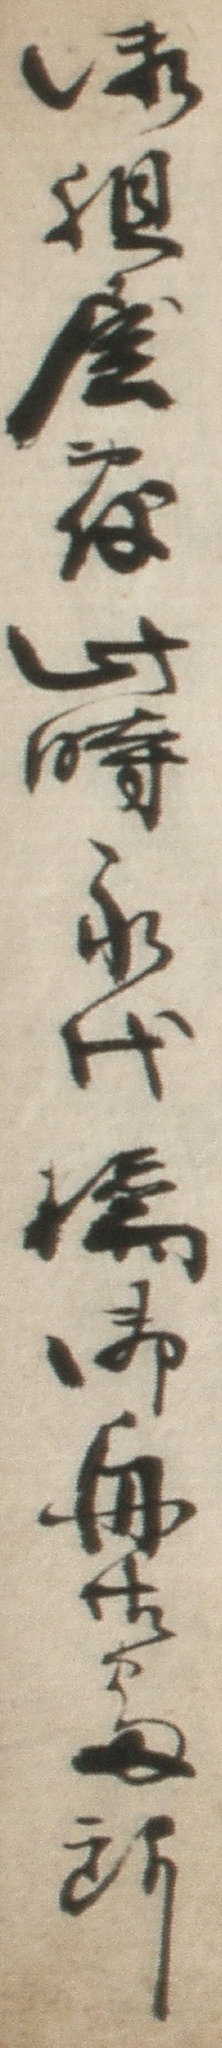御組屋敷此時永代橋御舟御番所
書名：文政十二丑としの類焼場所附
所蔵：東京大学地震研究所図書室 Earthquake Research Institute Library, The University of Tokyo, JAPAN
